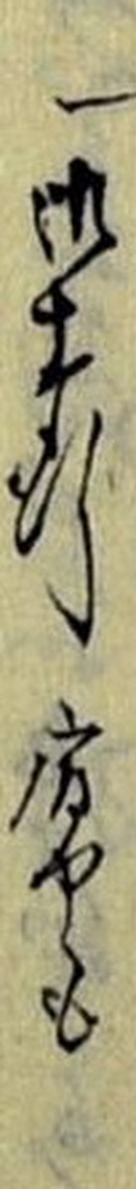御奉行府中へも
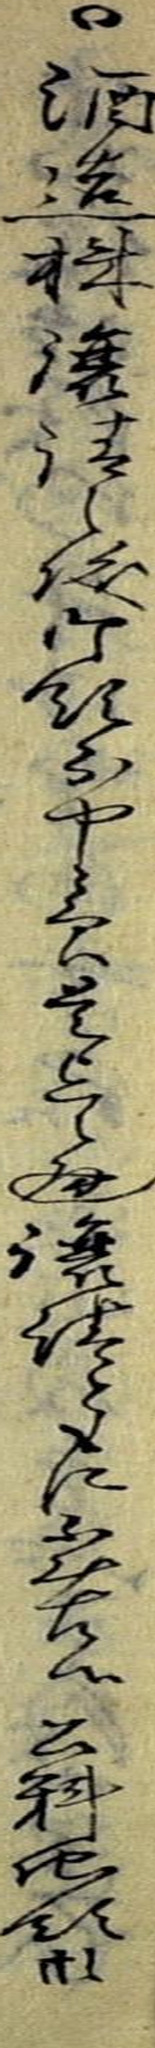○酒造株譲請之儀御領分中に而は是迄之通譲請ともに不苦候公料他領御
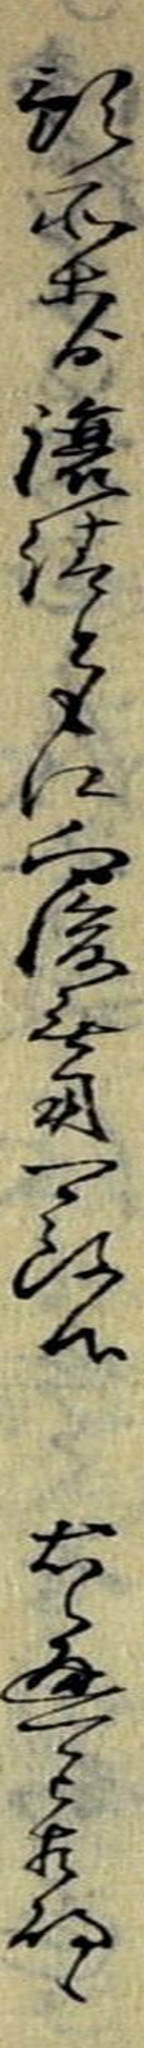領所等ゟ譲請ともに向後無用可致候右之通可被相触候
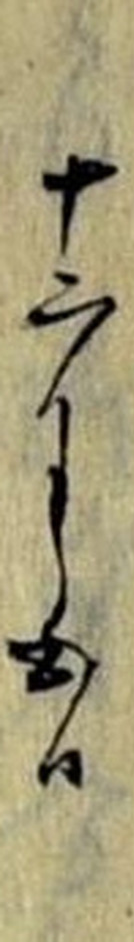十二月五日

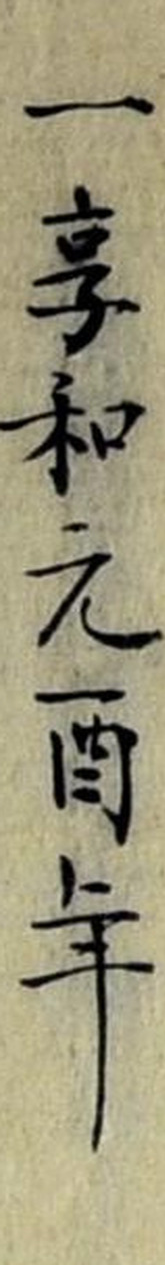一享和元酉年
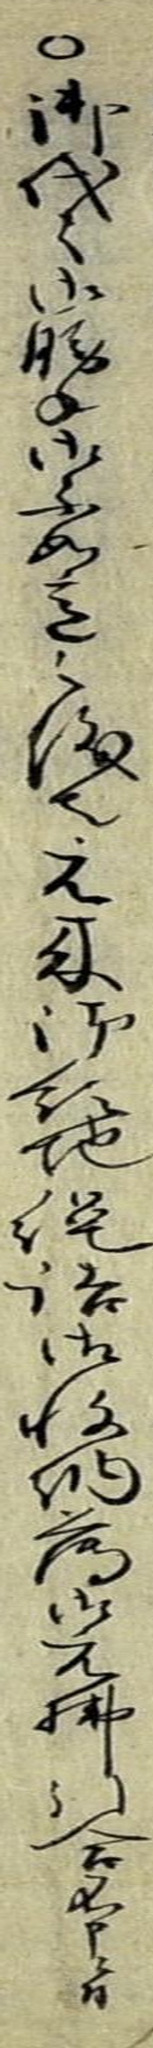○御代々御勝手不如意之儀は元来御領地縄詰御収納薄御元払引合不申に付
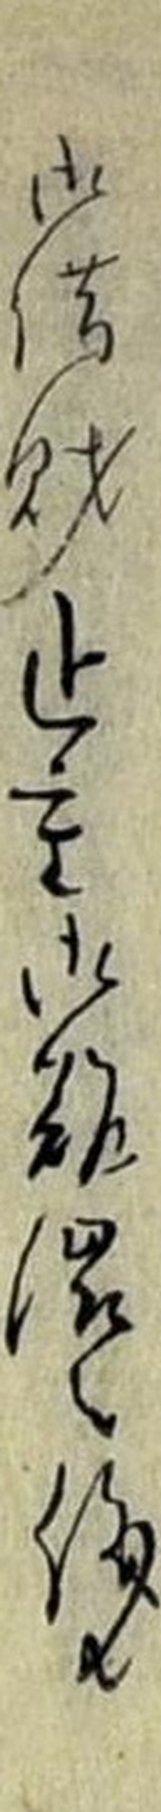御借財追重御難渋之儀共
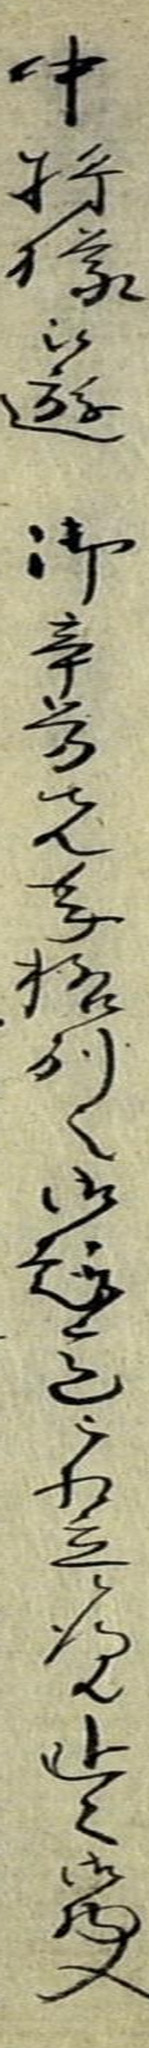中将様被遊御辛労先年格別之御趣意被相立候得共追々御物入
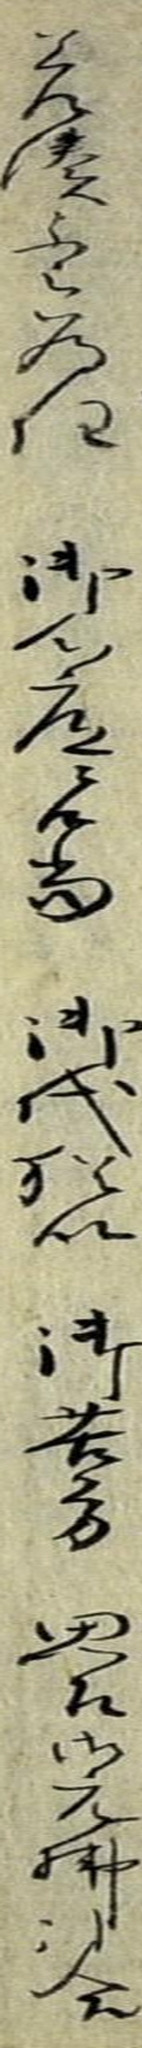差湊不被為任御心底に候当御代猶以御苦労思召御元払引合
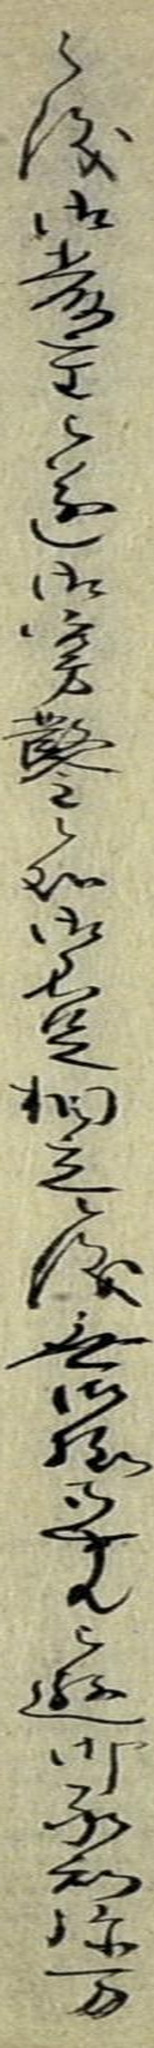之儀御厳重被遂御穿鑿候処御不足相立候義無御拠御事共被遊御承知弥万
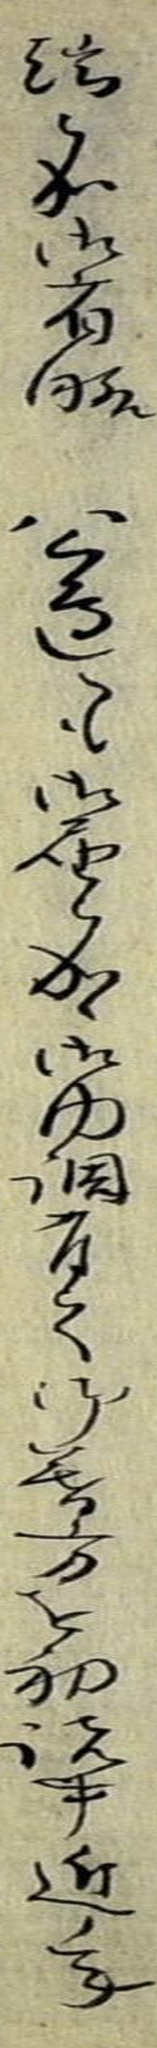端被成御省略公辺へも御届被成候御内調有之御暮方を初諸事近年
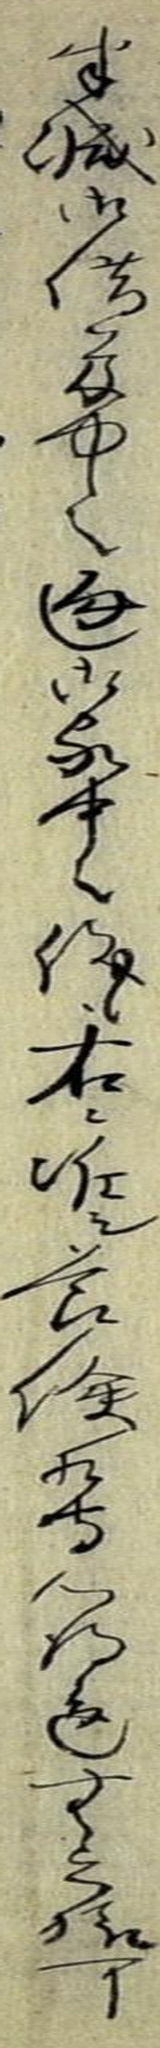半減御借米中之通御家中之儀も右に准し節倹相守心得違無之様可
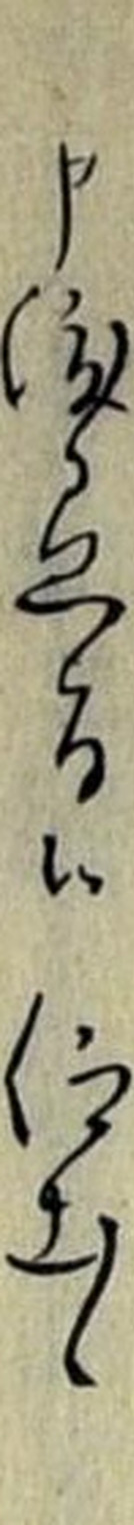申渡置旨被仰出候
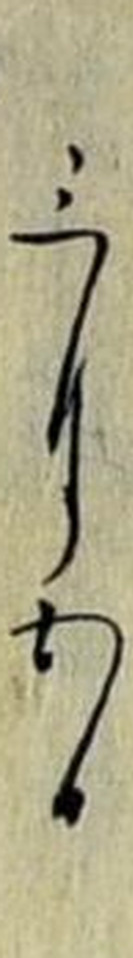三月五日
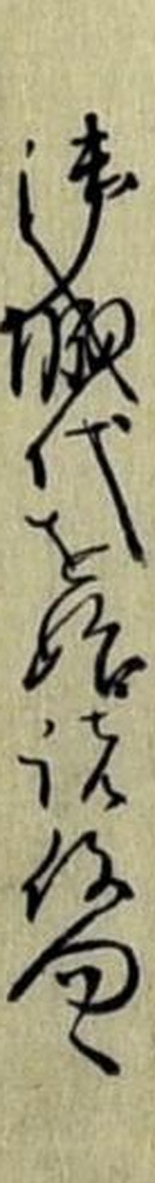御城代を始諸役向へ
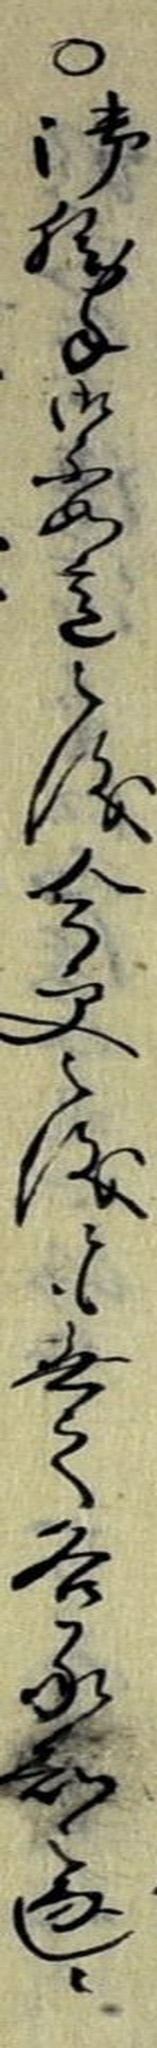○御勝手不如意之儀今更之儀にも無之各承知之通に
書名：命令之部 四
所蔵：福井県文書館 Fukui Prefectural Archives
